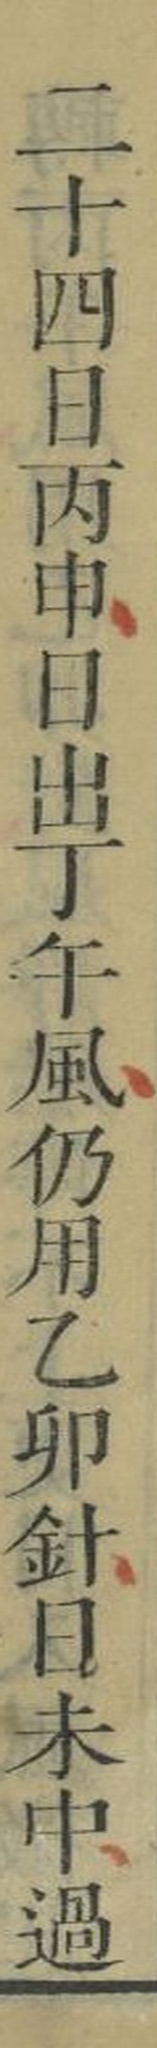二十四日丙申日出丁午風仍用乙卯針日未中過
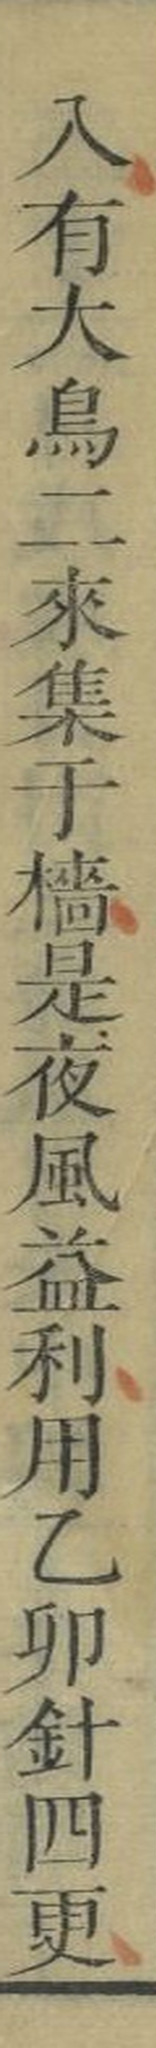入有大鳥二來集于檣是夜風益利用乙卯針四更
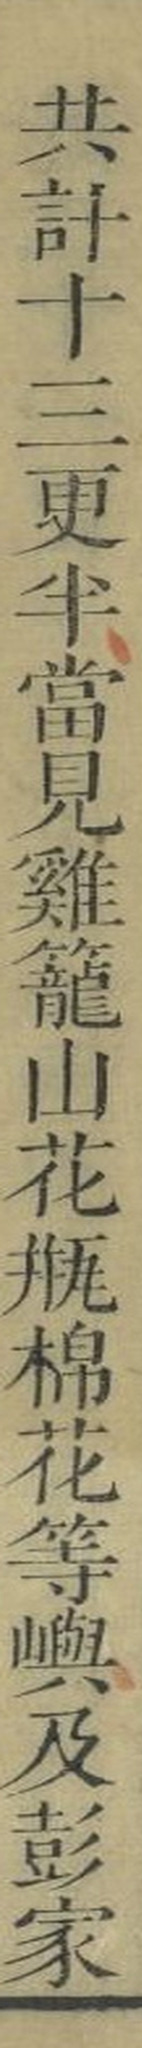共計十三更半當見雞籠山花瓶棉花等嶼及彭家
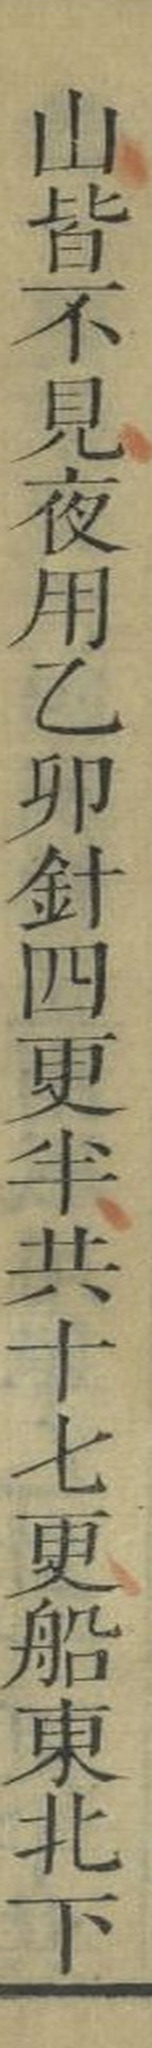山皆不見夜用乙卯針四更半共十七更船東北下

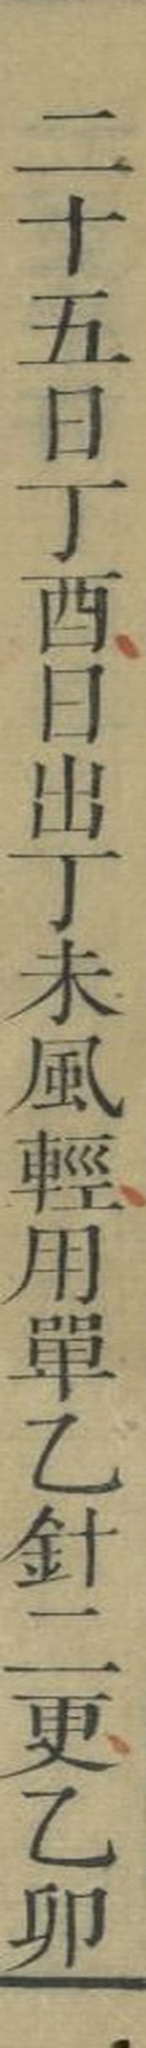二十五日丁酉日出丁未風輕用單乙針二更乙卯
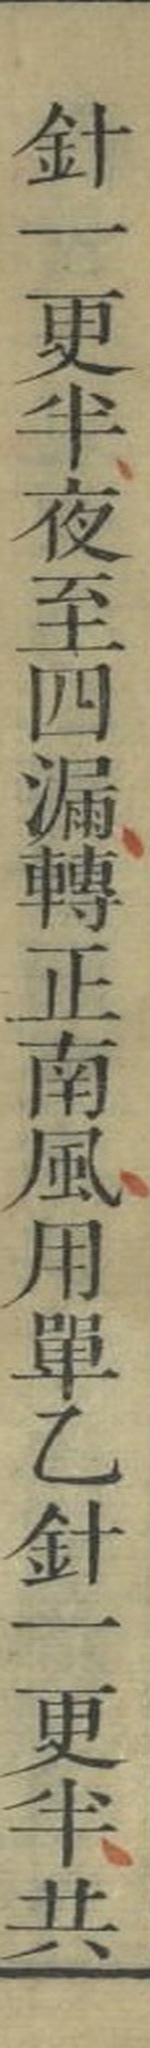針一更半夜至四漏轉正南風用單乙針一更半共
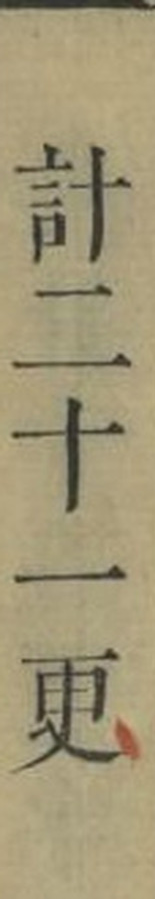計二十一更
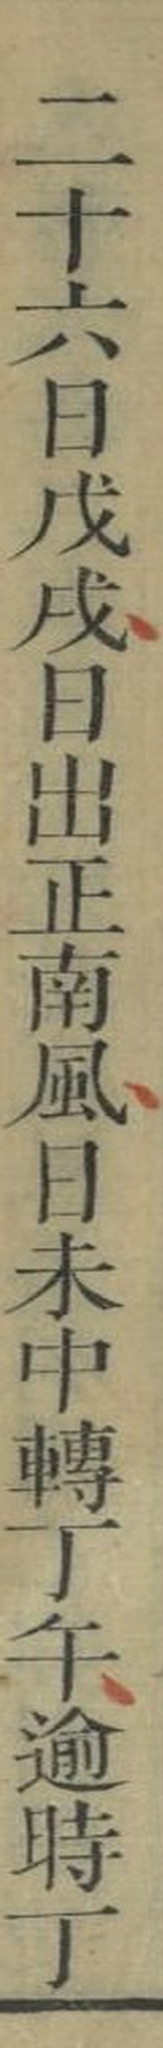二十六日戊戌日出正南風日未中轉丁午逾時丁
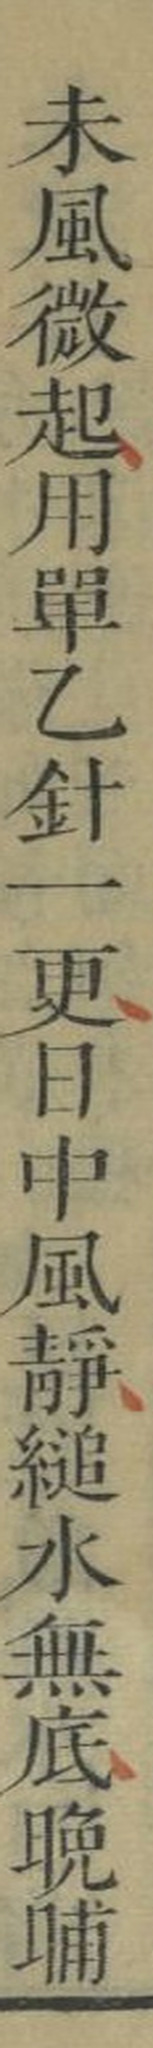未風微起用單乙針一更日中風靜縋水無底晩晡
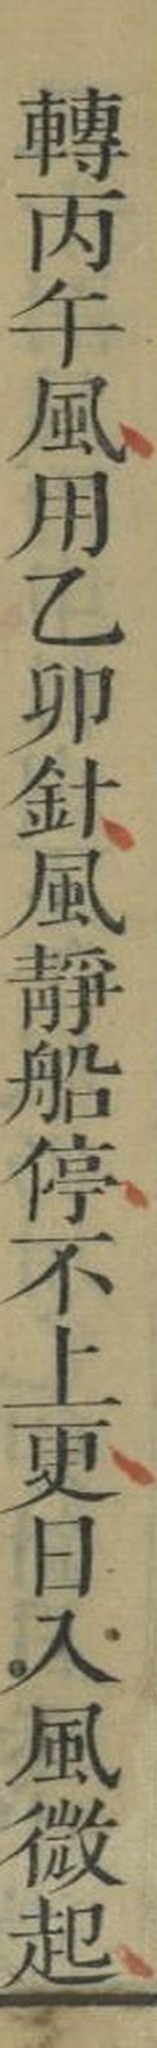轉丙午風用乙卯針風靜船停不上更日入風微起
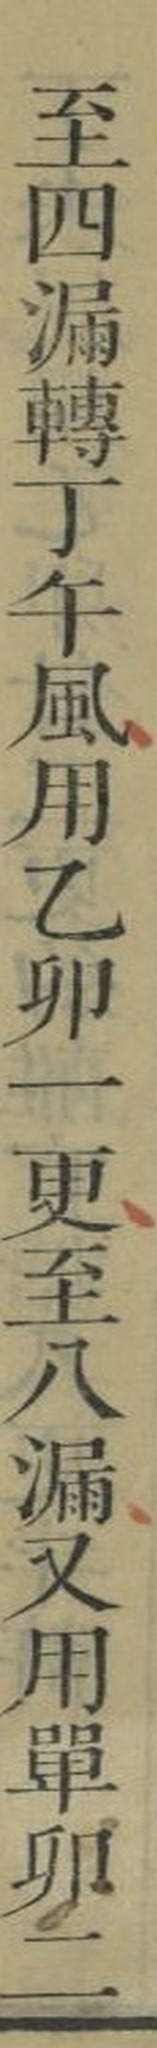至四漏轉丁午風用乙卯一更至八漏又用單卯二
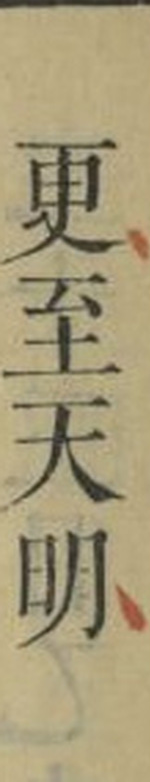更至天明
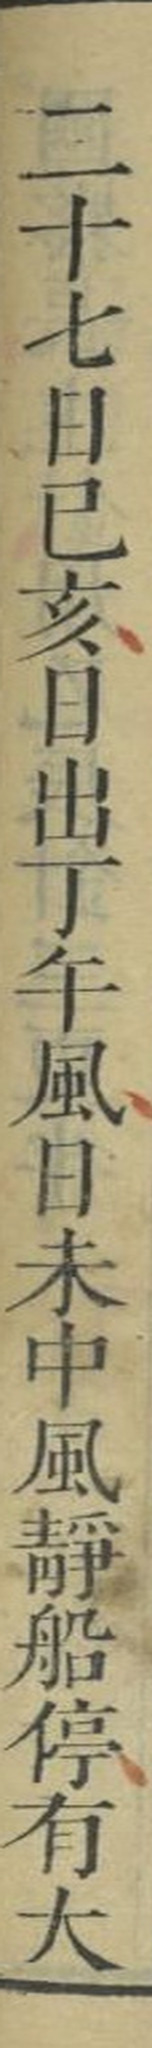二十七日巳亥日出丁午風日未中風靜船停有大
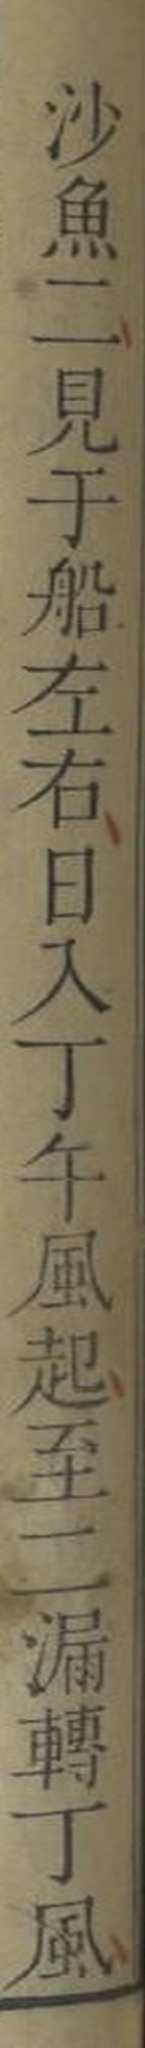沙魚二見于船左右日入丁午風起至二漏轉丁風
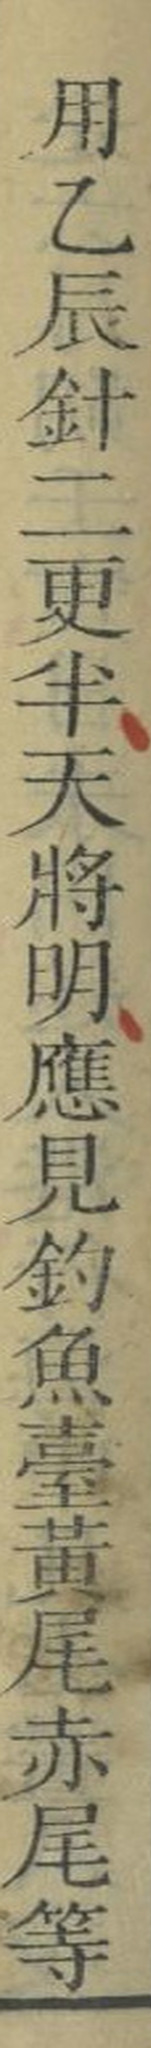用乙辰針二更半天將明應見釣魚臺黃尾赤尾等
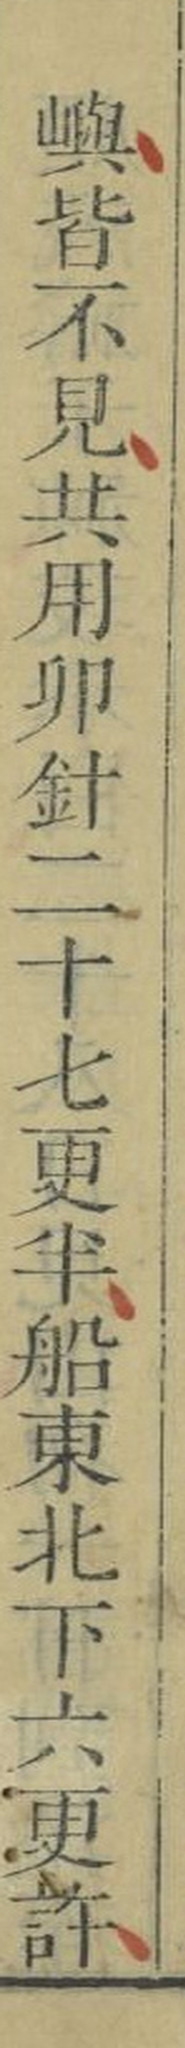嶼皆不見共用卯針二十七更半船東北下六更許
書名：中山伝信録 巻一、巻二
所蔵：University of the Ryukyus Library
